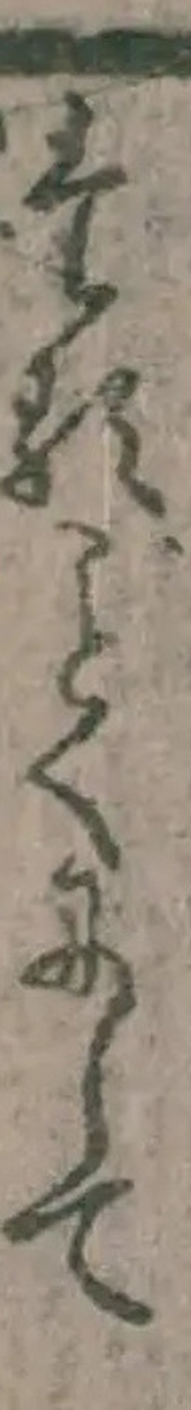たることくにして
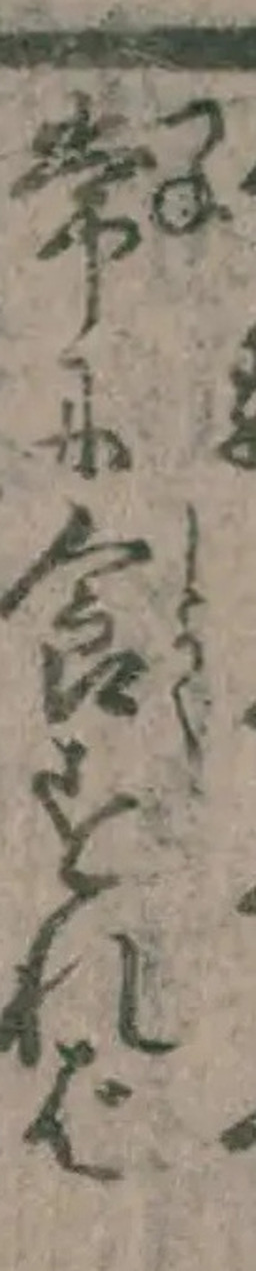常に食すれば
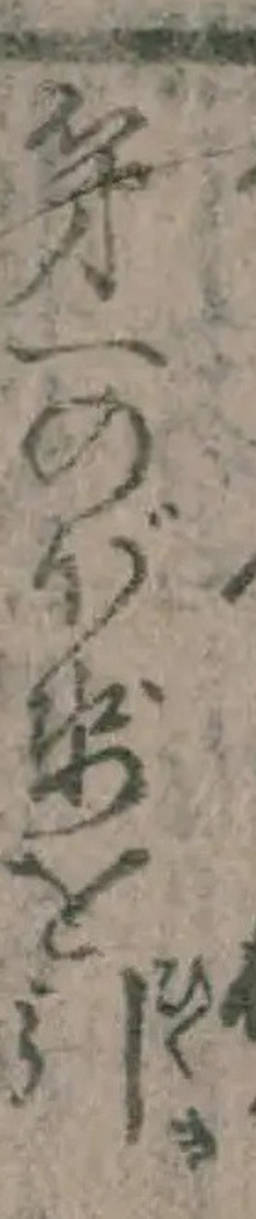第一のぼせを引
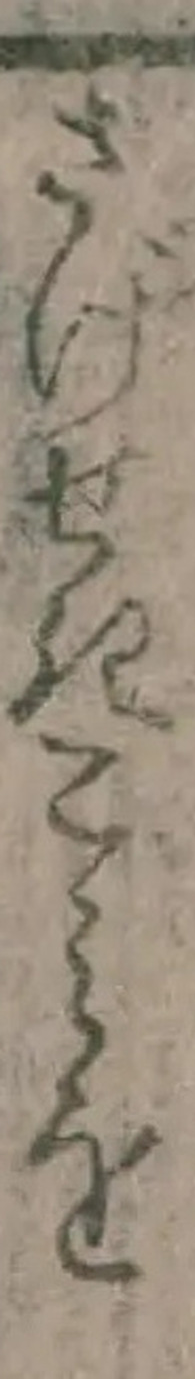さげせきこみを
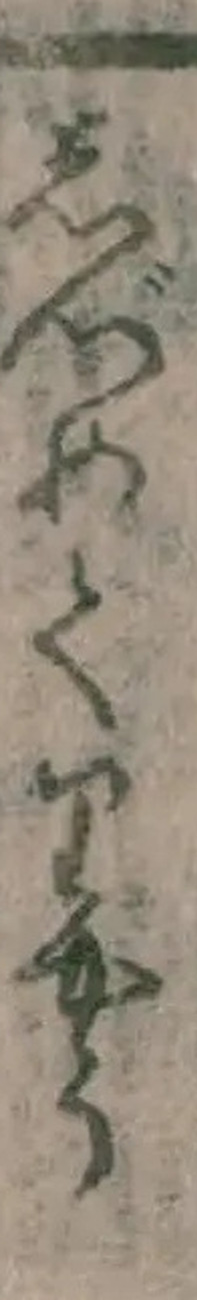しづめてりやう
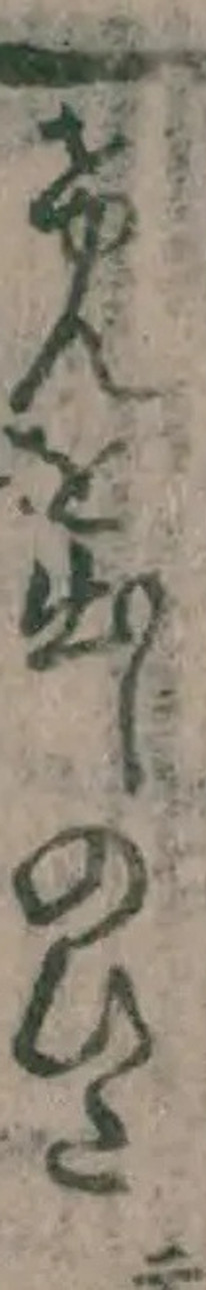けんを出しのひた
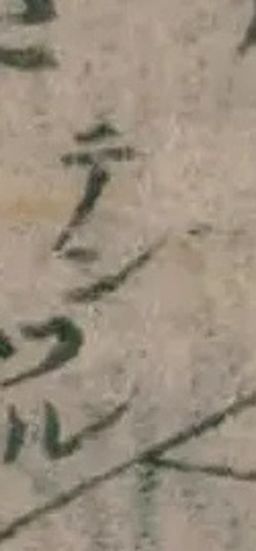テンツル
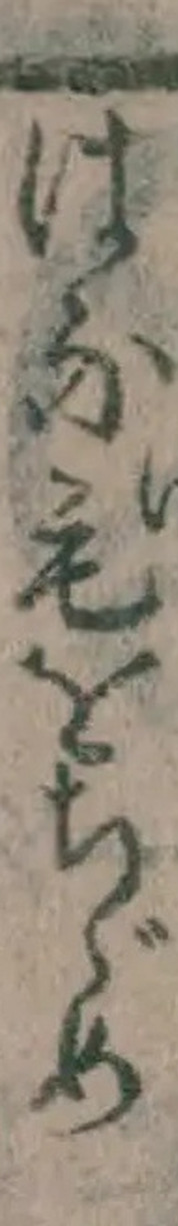はな毛をちゞめ
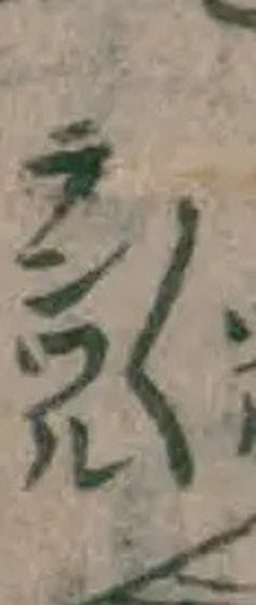テンツル
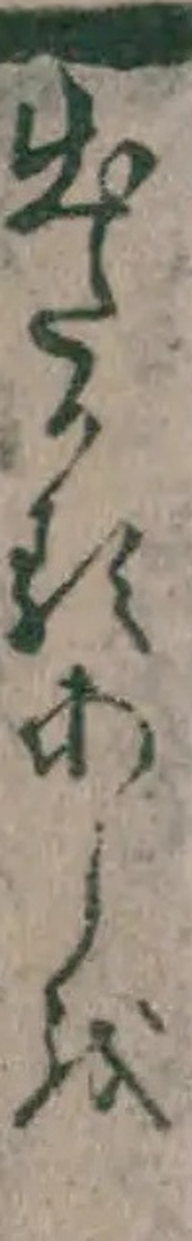出たかるあしを
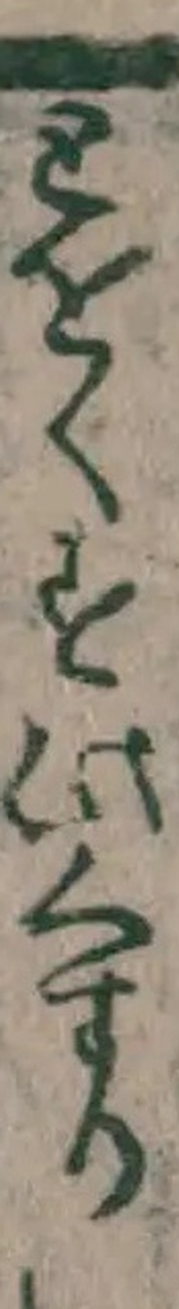とをくす此くすり
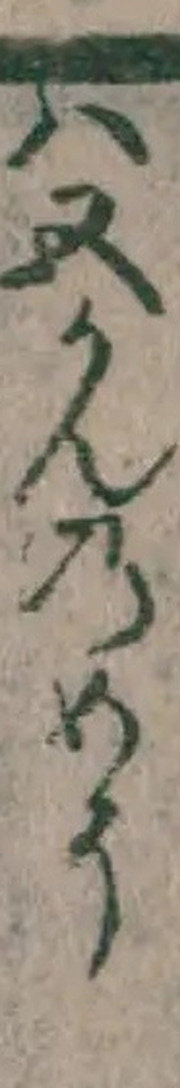は五かんのめう
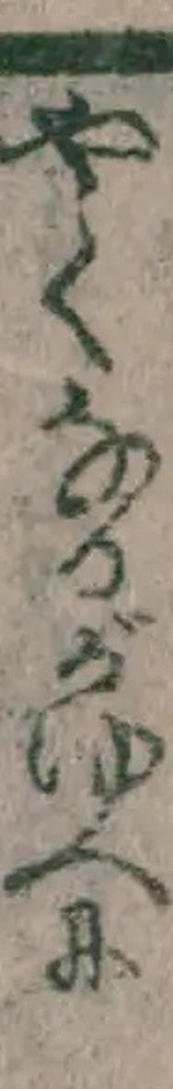やくなるがゆへに
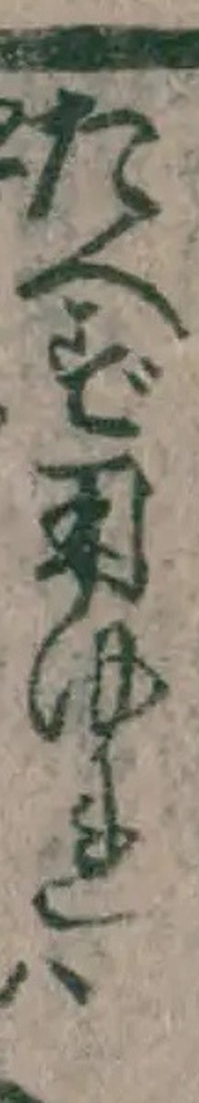たへず用ゆれは
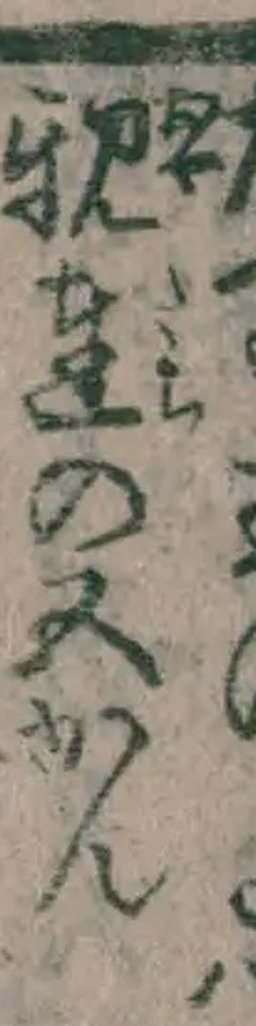親達の五かん
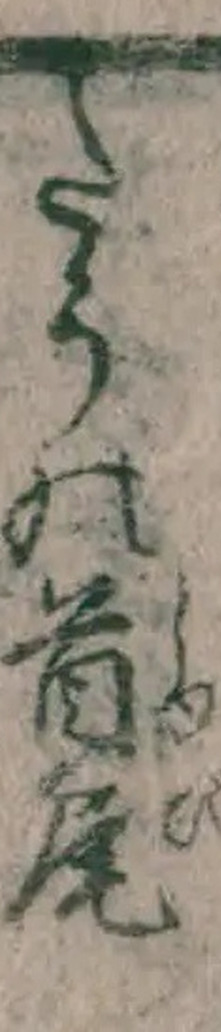たうの首尾
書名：視薬霞報条 3巻
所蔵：国立国会図書館 National Diet Library, JAPAN
